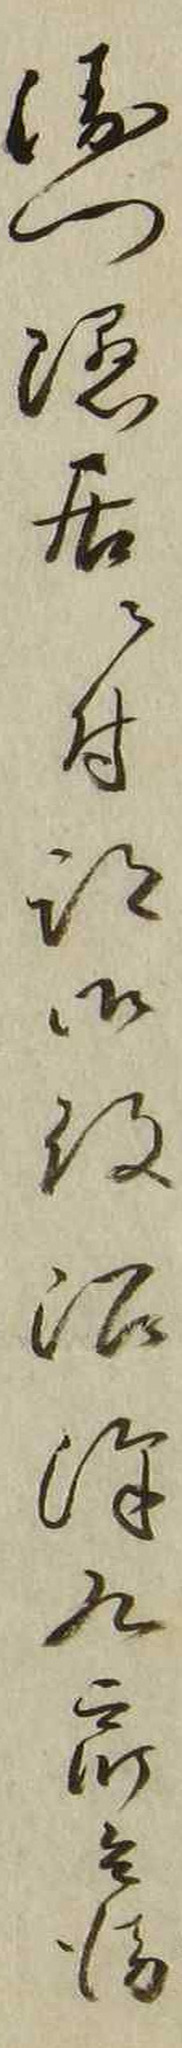衛門隠居に付跡御役沼沢九郎兵衛
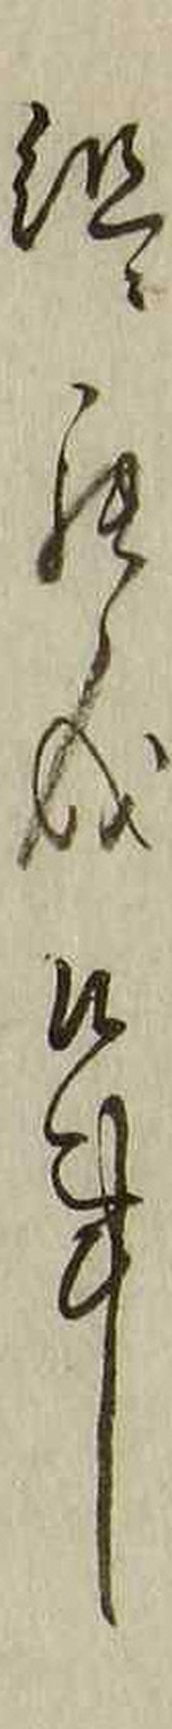組に罷成候事
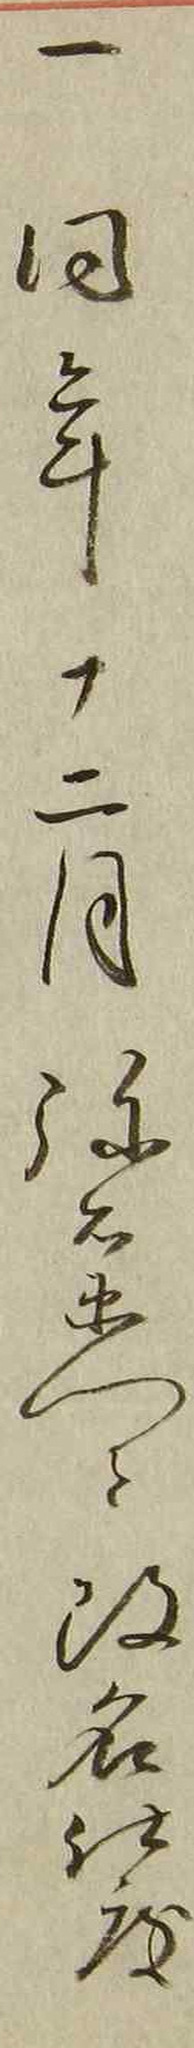一同年十二月弥右衛門と改名仕度
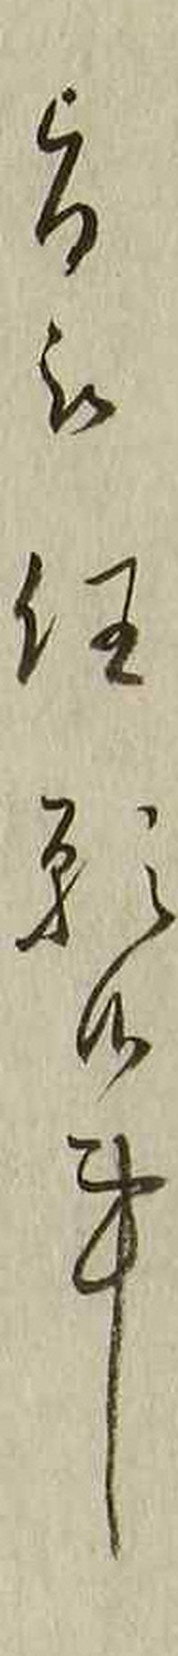旨被任願候事
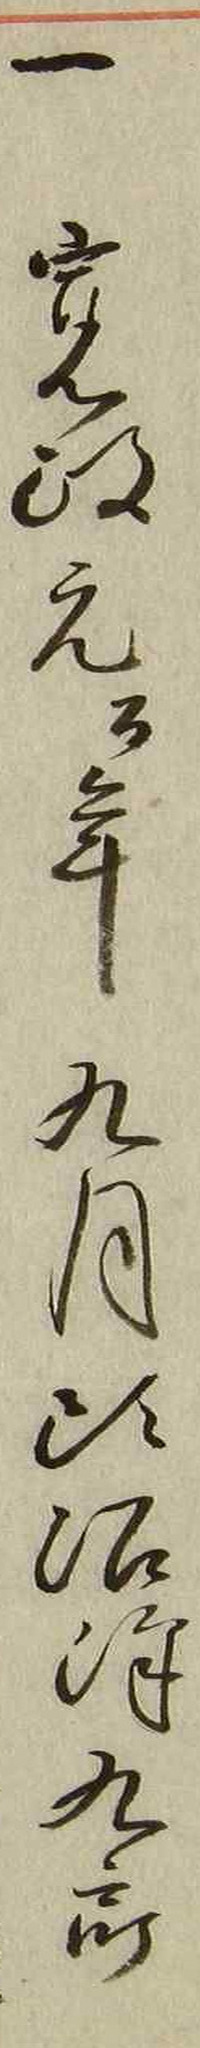一寛政元酉年九月頭沼沢九郎
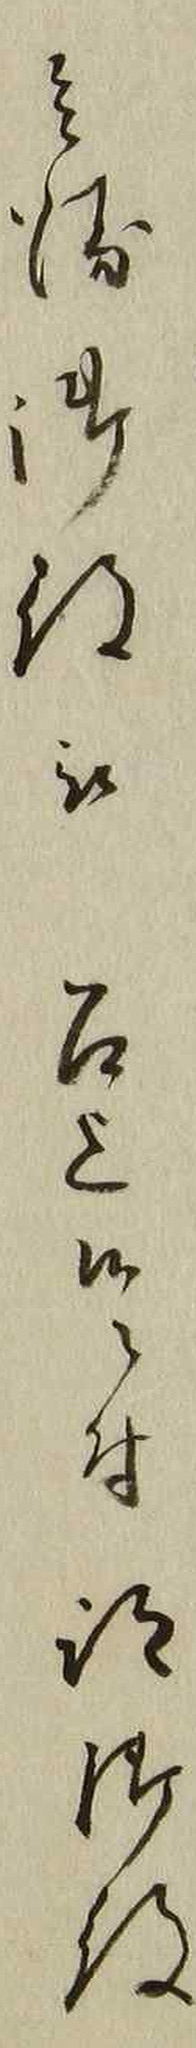兵衛御役被召上候に付跡御役
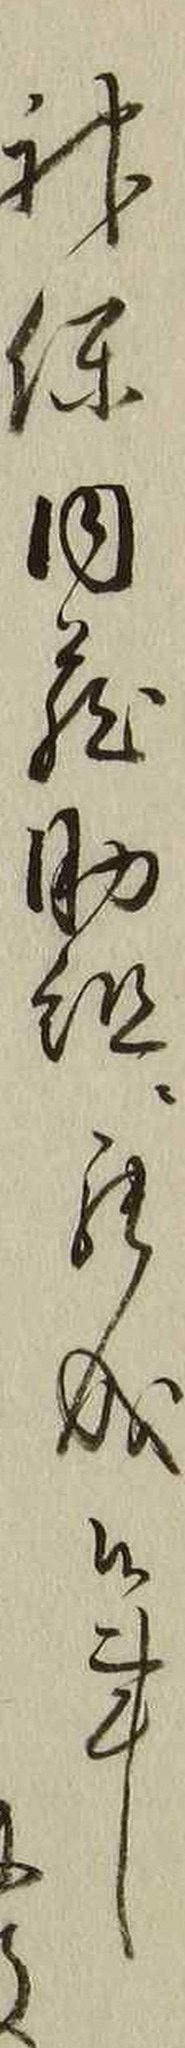神保内蔵助組に罷成候事
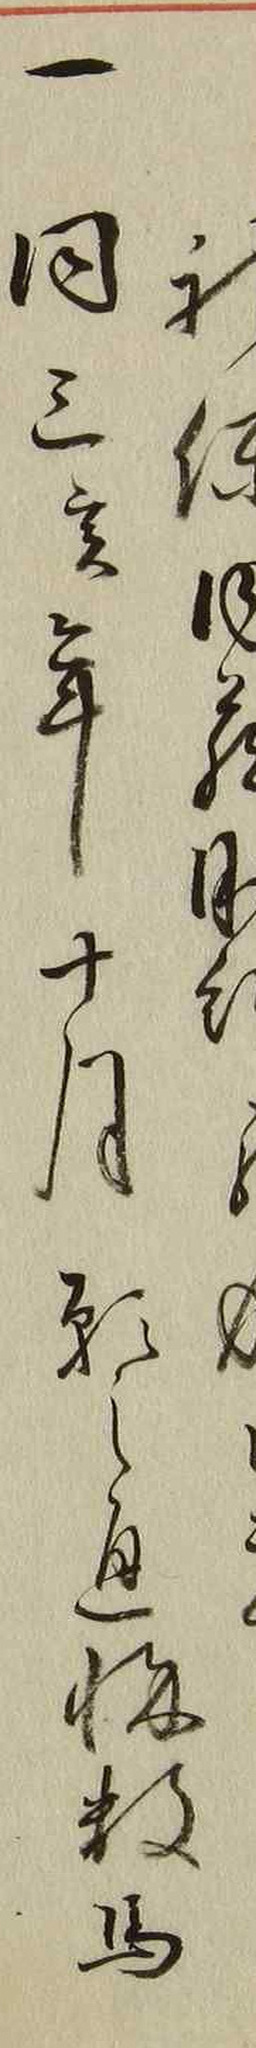一同三亥年十月願之通忰数馬
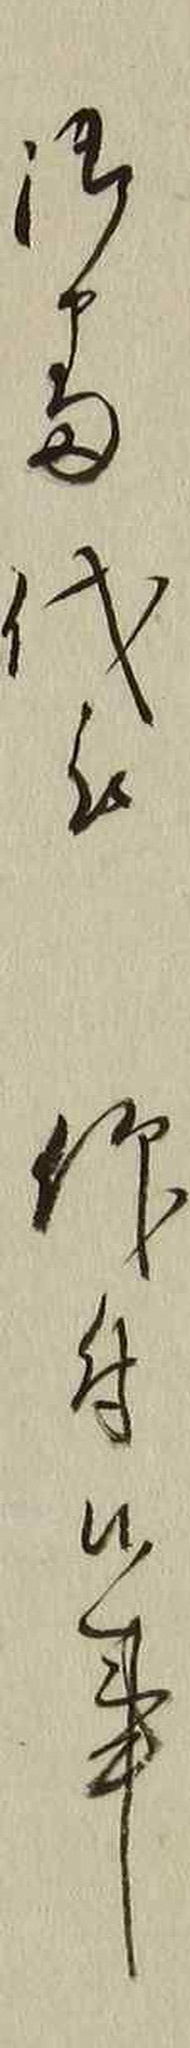御番代被仰付候事
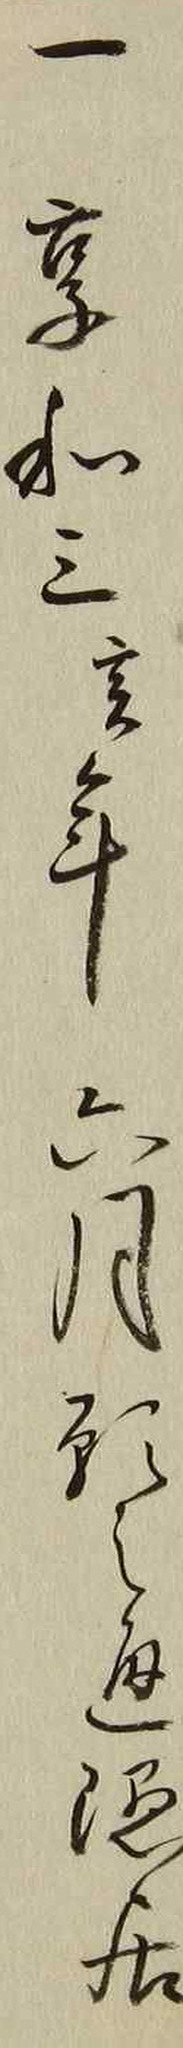一享和三亥年六月願之通隠居
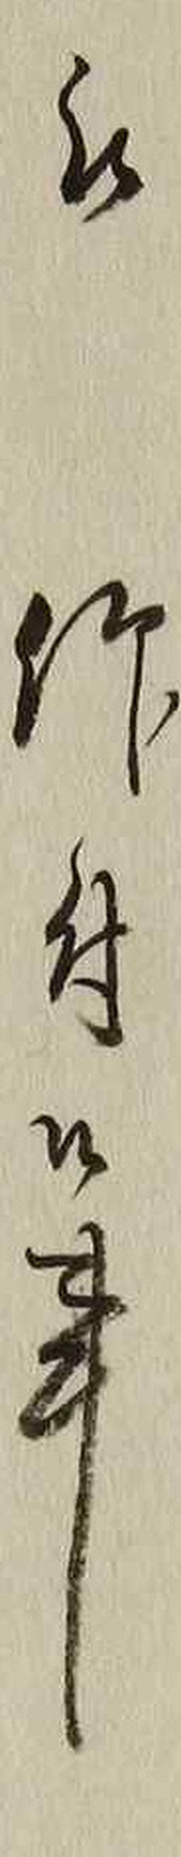被仰付候事
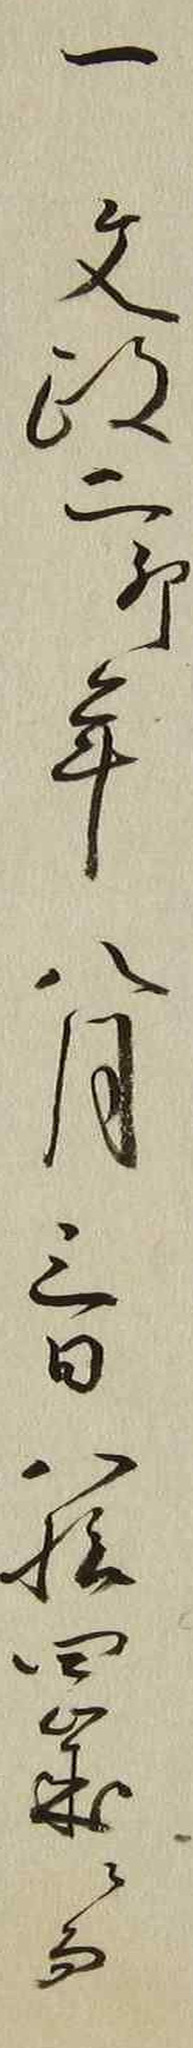一文政二卯年八月三日八拾四歳に而
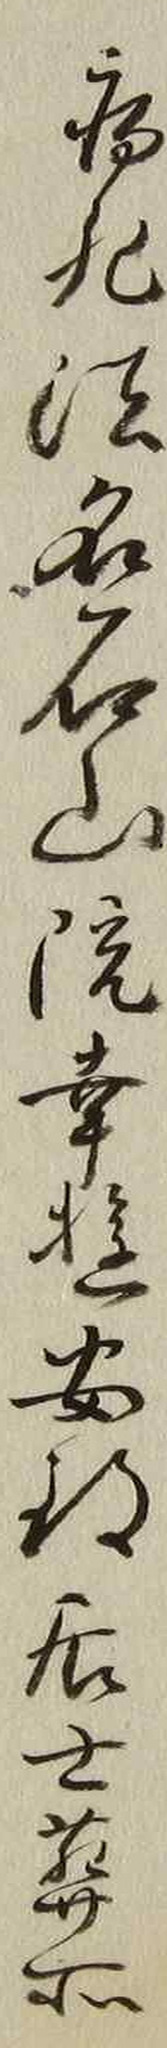病死法名石山院幸遊安致居士葬所
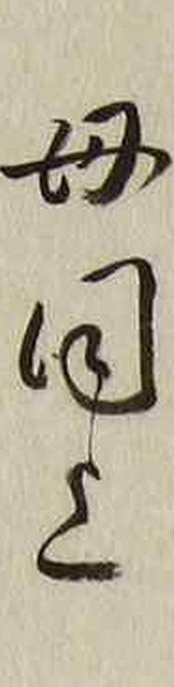母同上

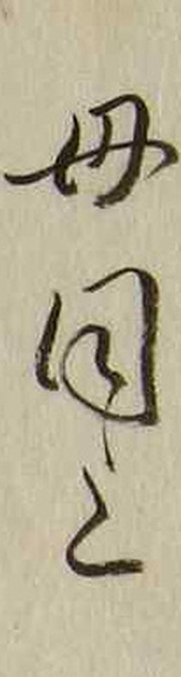母同上
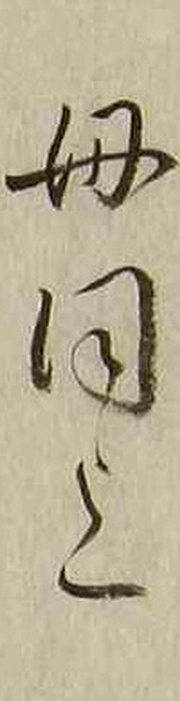母同上
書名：諸士系譜　巻之6　い之部6
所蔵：会津若松市立会津図書館
